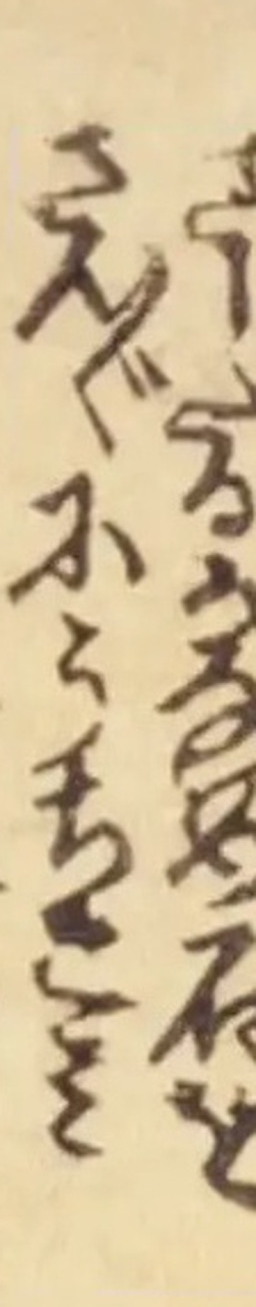さん〴〵にうちこみ
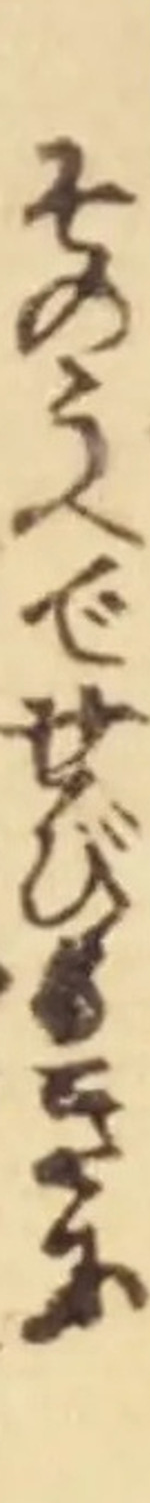そのうへでせびらきに
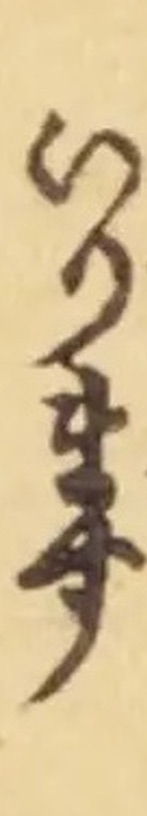いります
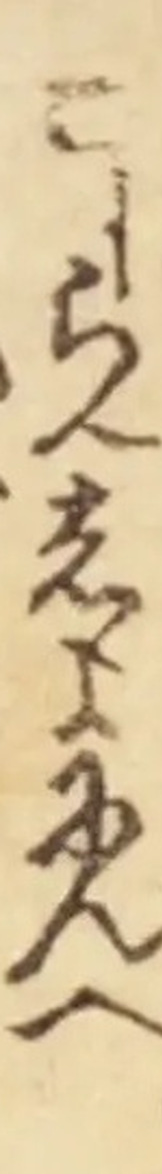こしらへしよにんへ
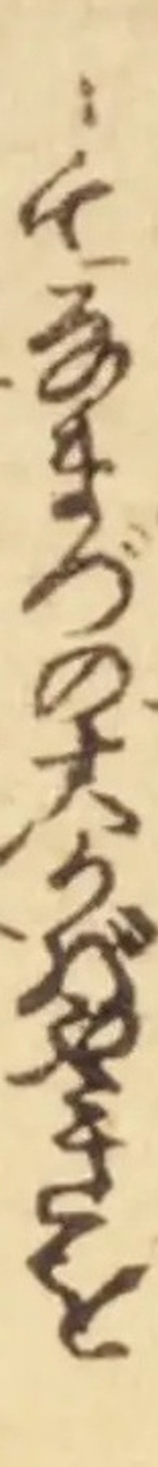してなまづの大かばやきを
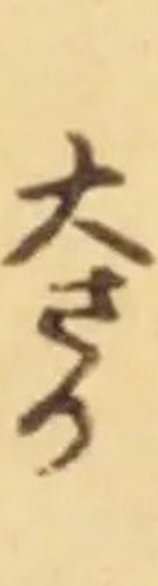大さか
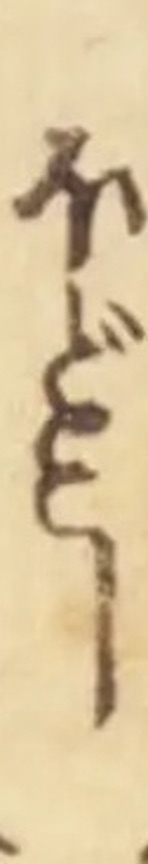ほどこし
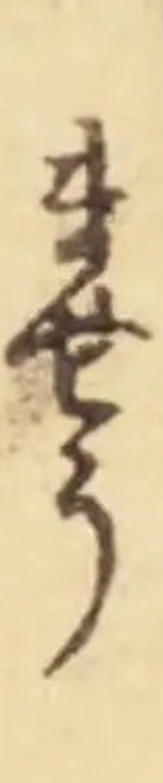ませう
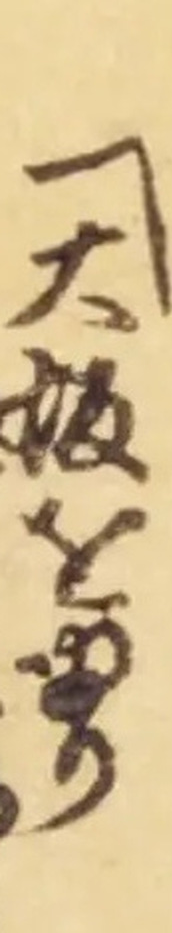「大阪をゆり
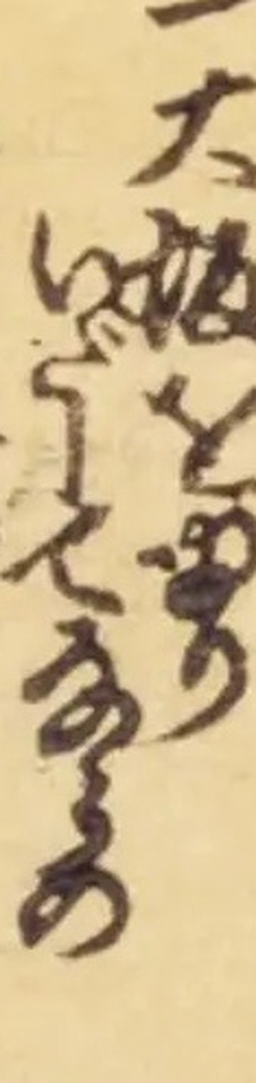いだしてならの
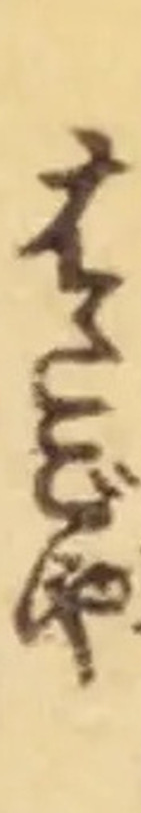はたごや
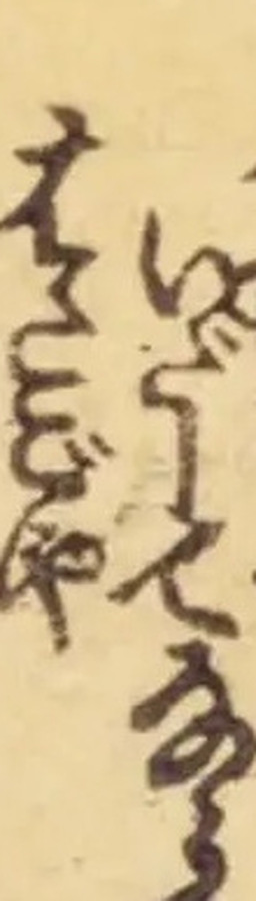はたごや
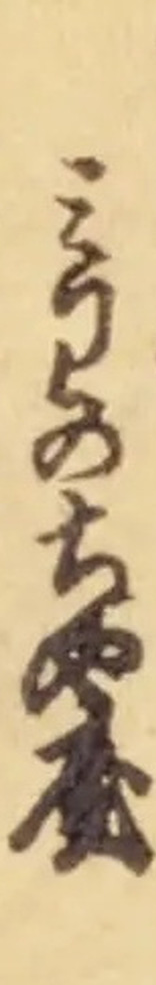みわのちや屋
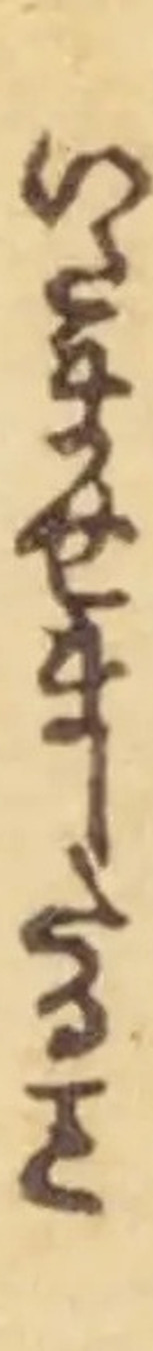いたませましたること
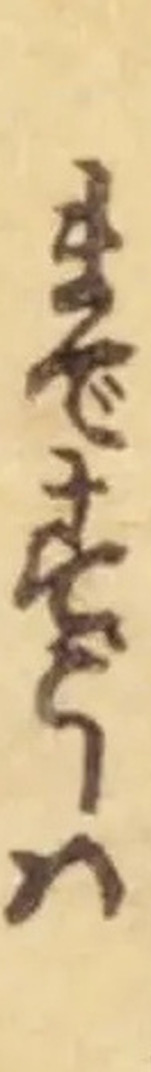まですこしは
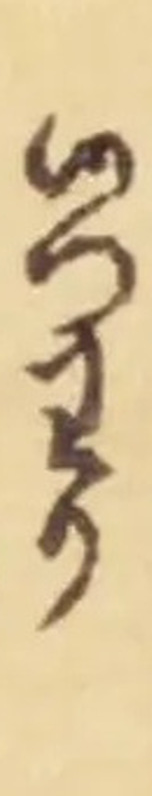いつわり
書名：（地震鯰の取調べ）
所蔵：国立国会図書館 National Diet Library, JAPAN
